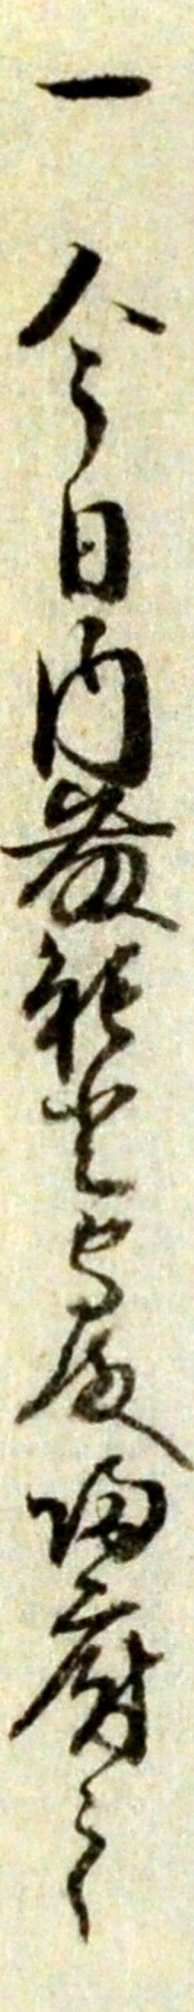一今日内藤能登守殿帰府之
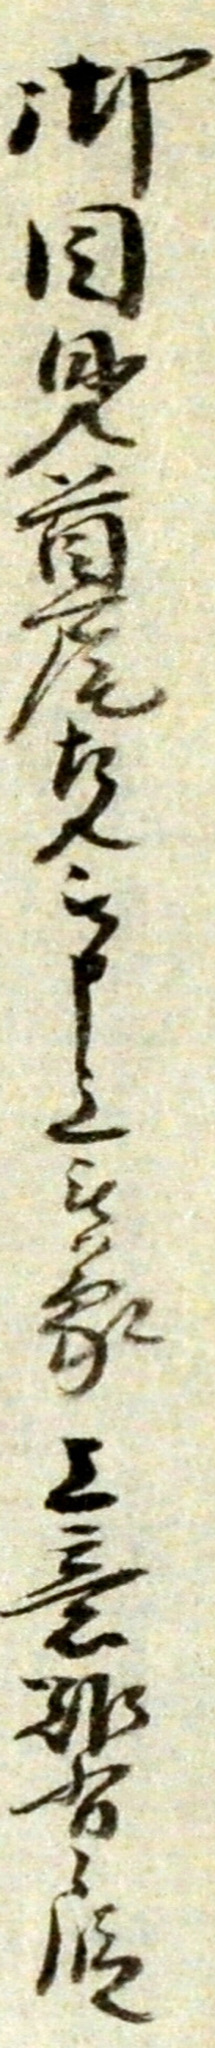御目見首尾克被申上被蒙上意難有候段
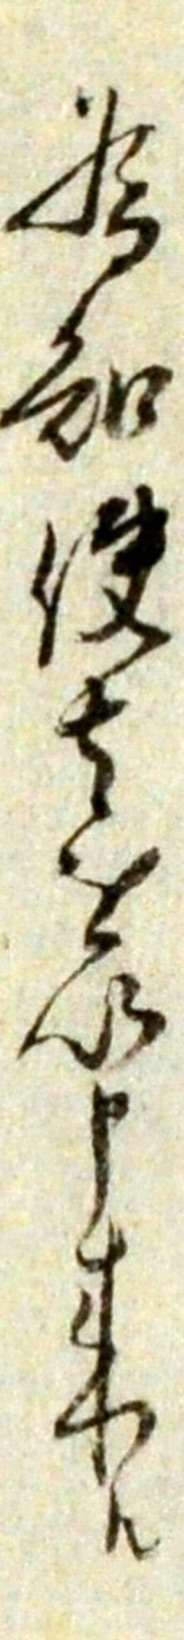為知使者を以申来ㇽ
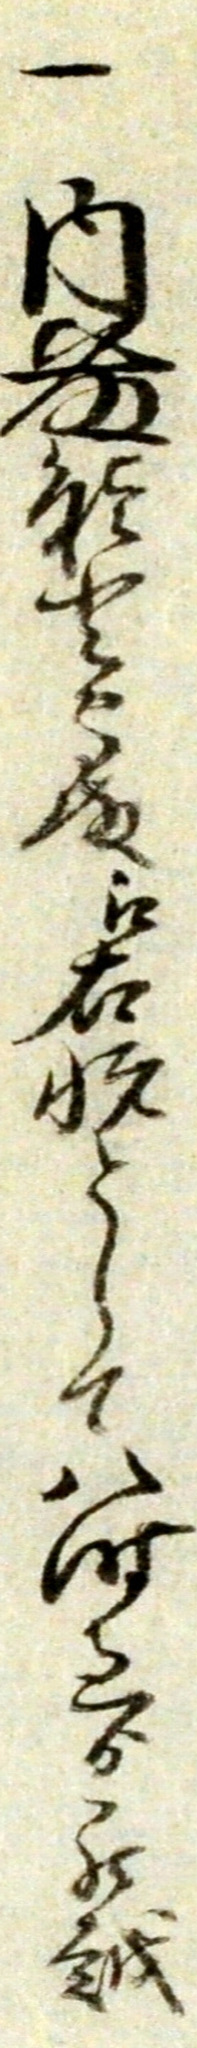一内藤能登守殿江右悦として八時過ゟ罷越
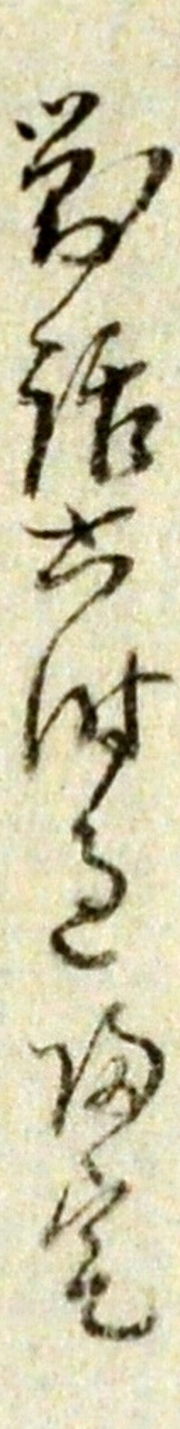対話六時過帰宅
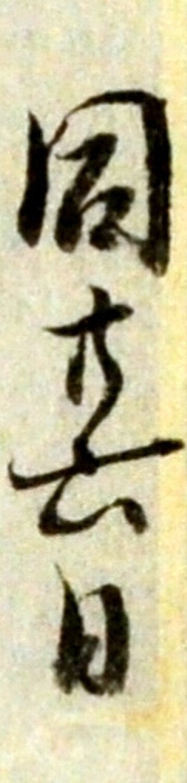同廿六日
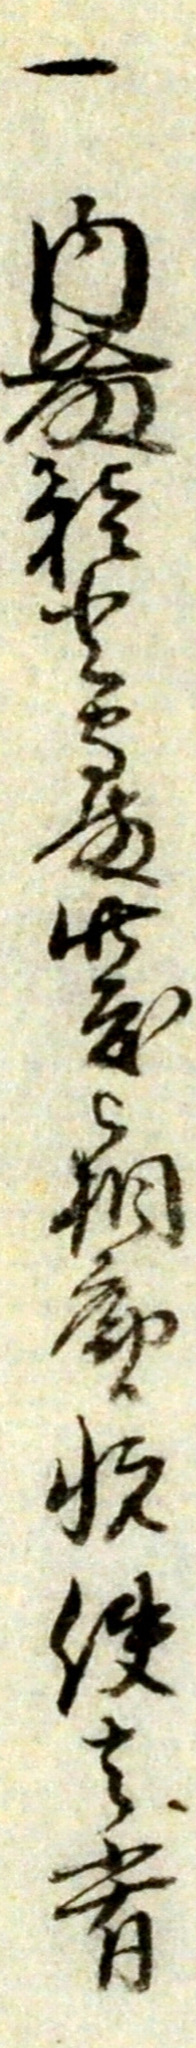一内藤能登守殿此度被相勤候悦使者肴
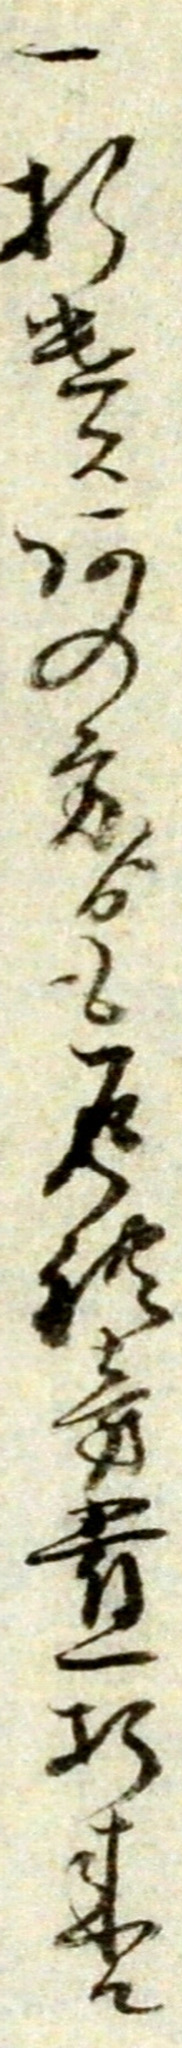一折遣ㇲ阿の方ゟも返礼旁肴一折来ㇽ

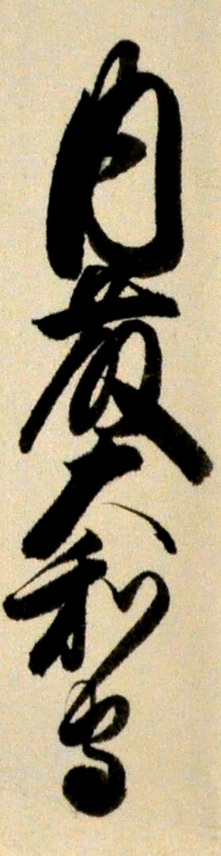内藤大和守
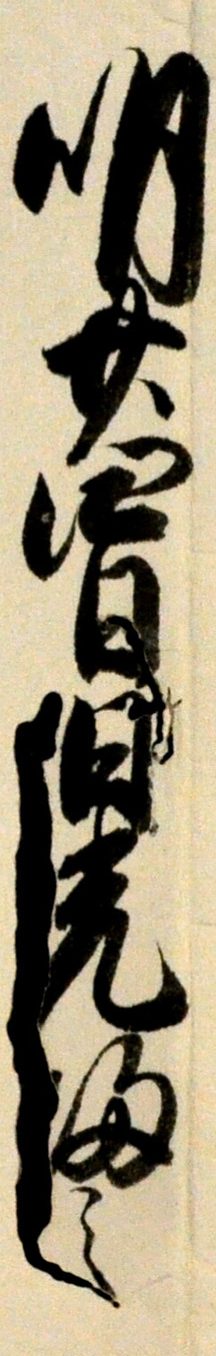明廿四日日光帰之
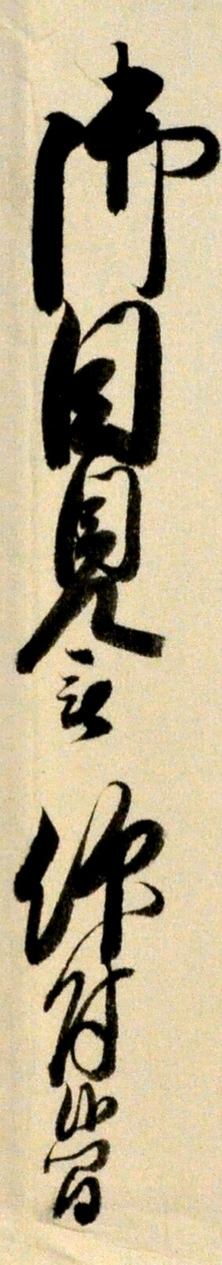御目見被仰付候間
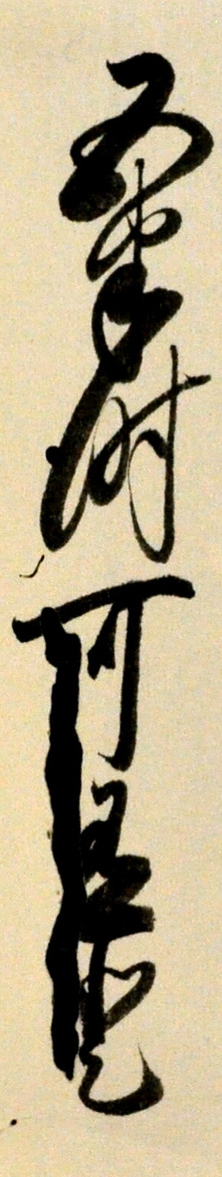五半時可有登
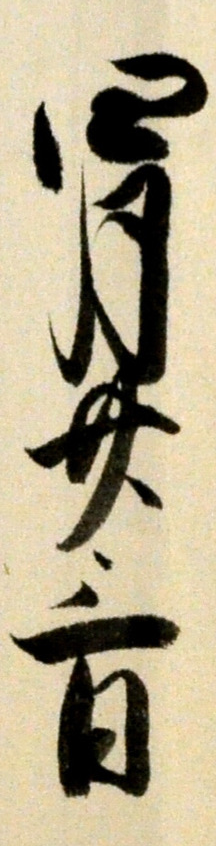四月廿三日

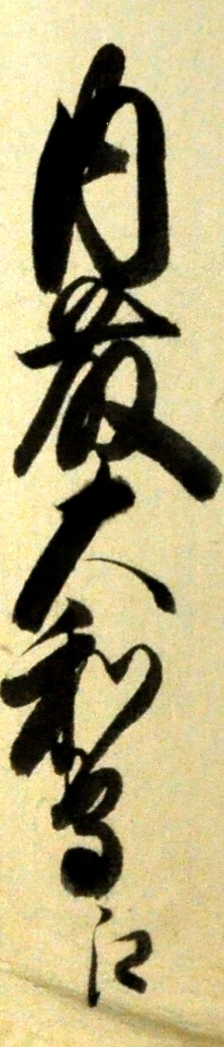内藤大和守江

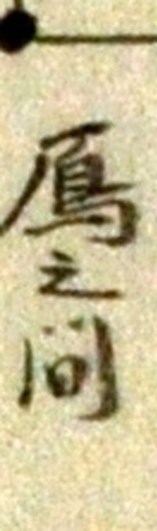雁ノ間
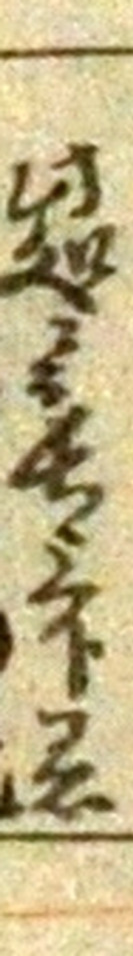此処ニ而長上下着替
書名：日光御名代相勤候節ノ留
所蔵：伊那市立高遠町図書館・合同会社AMANE
